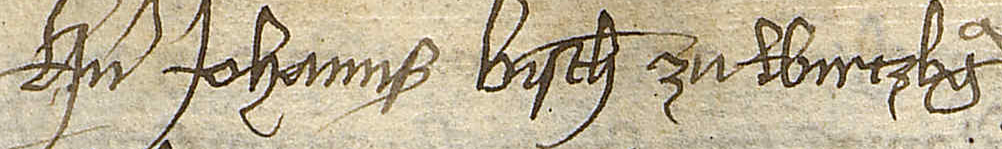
Hn* Iohannſ* biſch* ʒu Wircʒbg*
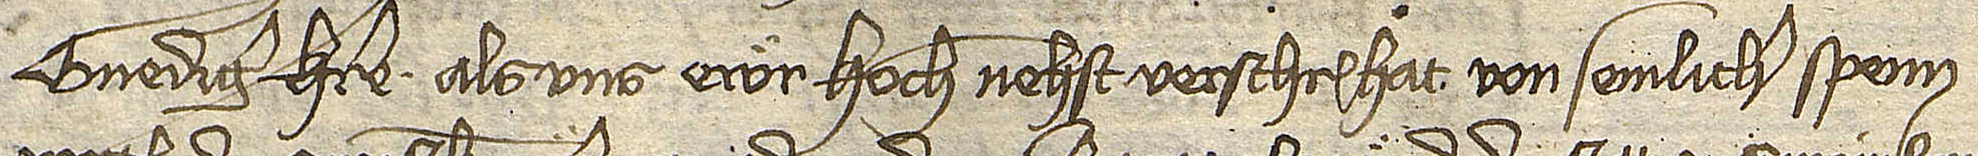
Gnedig* Hre* . als vns ewr Hoch* nehſt verſchr* hat . von ſemlich* ſpenn
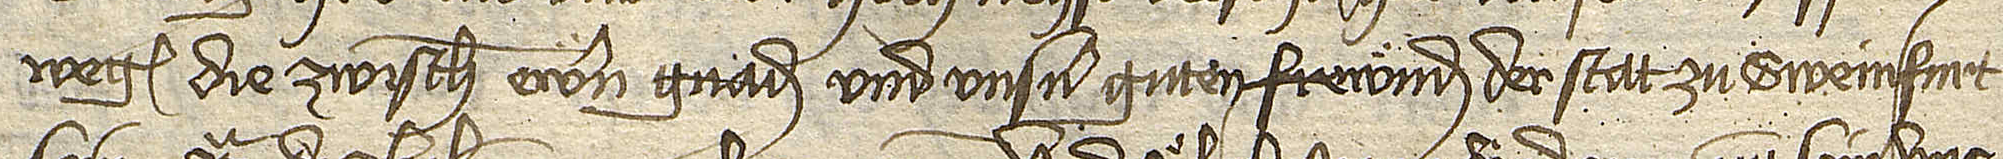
weg* die ʒwiſch* ew*n gnad* vnd vnſn* guten frewnd* der ſtat ʒu Sweinfurt
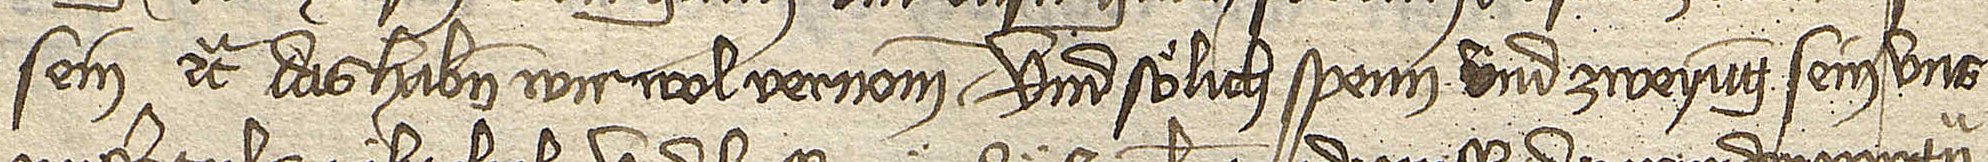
ſein ec* das habn* wir wol vernom* / Vnd ſölich ſpenn vnd ʒweiyug* ſein vns
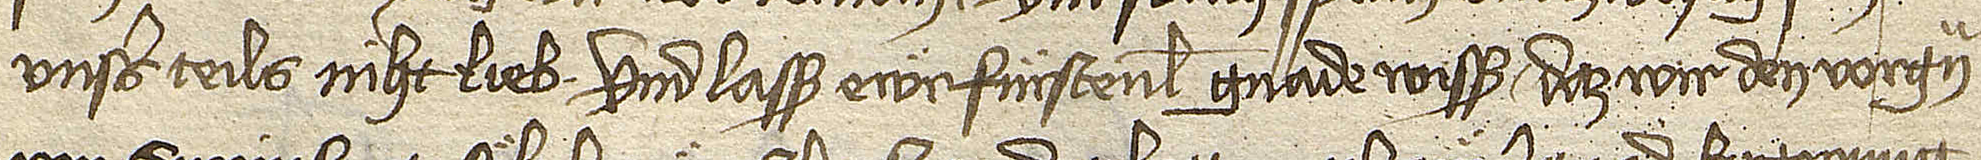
vnſ*s teils niht lieb . Vnd laſſ* ewr fürſtenl* gnade wiſſ* / daʒ wir den vorgn*
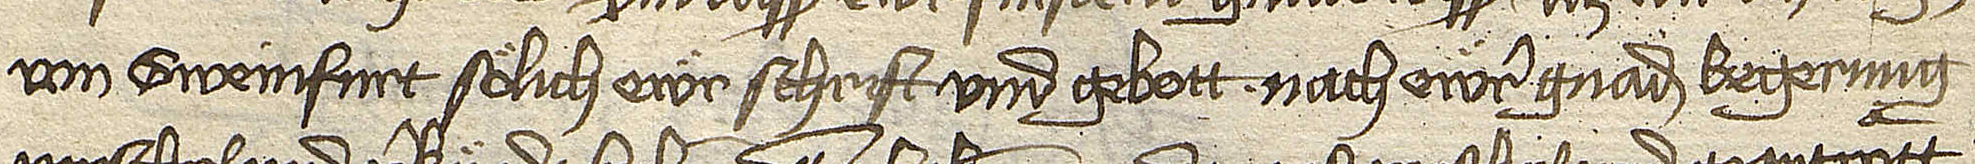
von Sweinfurt ſölich ewr ſchrift vnd gebott . nach ewr* gnad* begerung
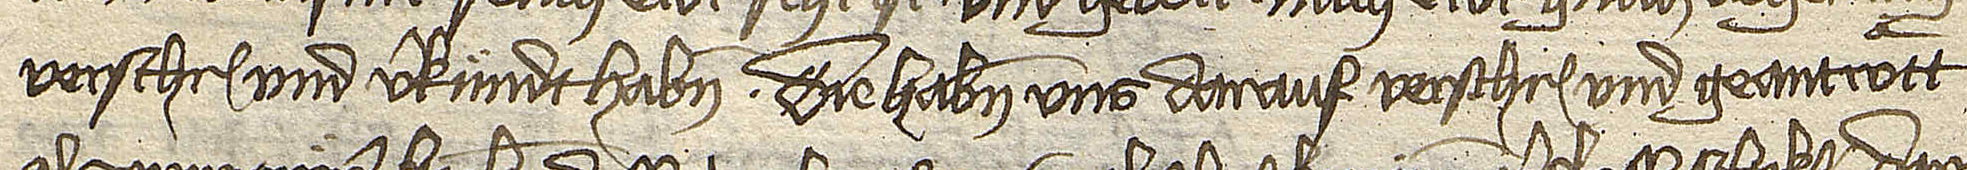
verſchr* vnd v*kündt habn* . Die habn* vns darauf verſchr* vnd geantw*tt
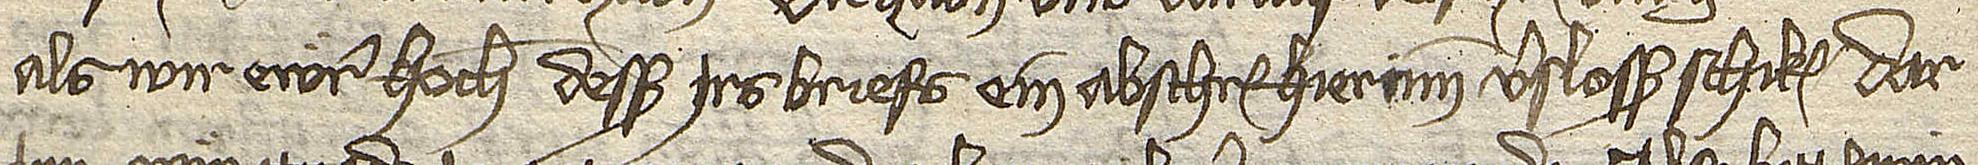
als wir ewr* Hoch* deſſ* Irs briefs ein abſchr* hierinn* v*ſloſſ* ſchik* Dar
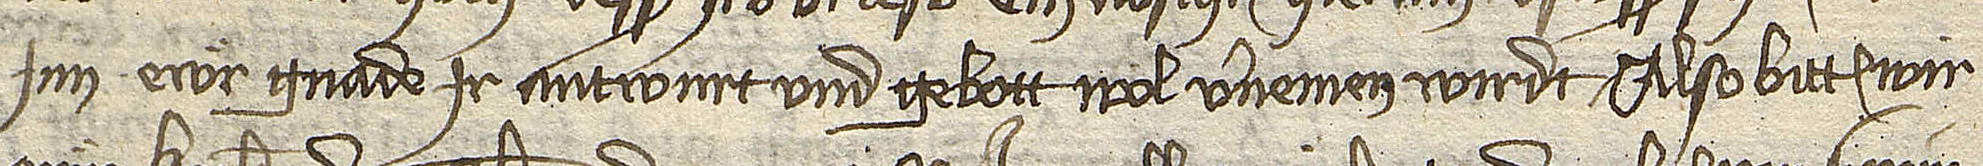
Inn ewr gnade Ir antwurt vnd gebott wol v*nemen wirdt / Alſo bitt* wir
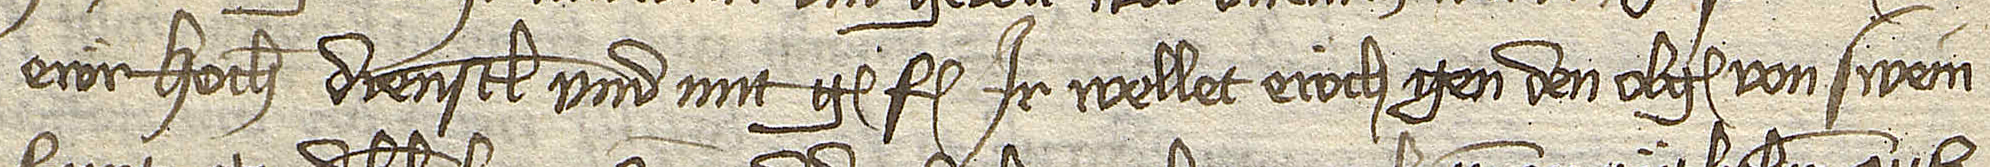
ewr Hoch* dienſt* vnd mit g* f* Ir wellet ewch gen den obg* von ſwein
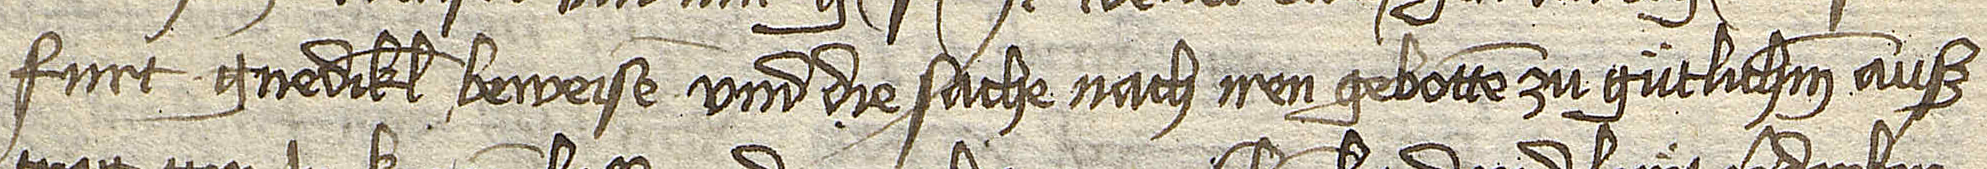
furt gnedikl* beweiſe* vnd die ſache nach iren gebotte* ʒu gütlichm* auſʒ
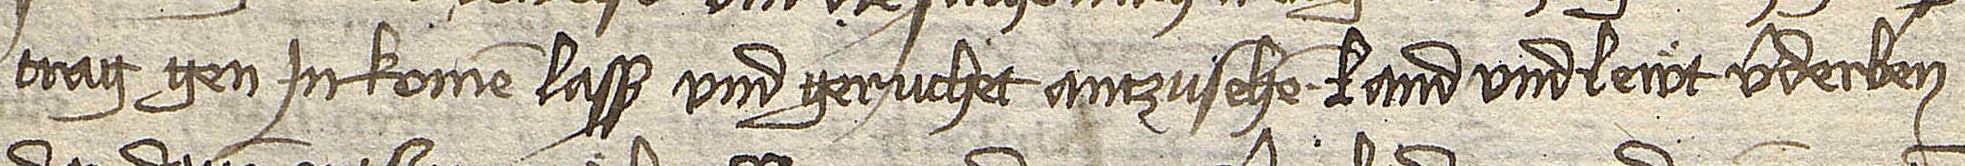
trag gen In kome* laſſ* vnd geruchet ancʒuſehe* . land vnd lewt v*derben
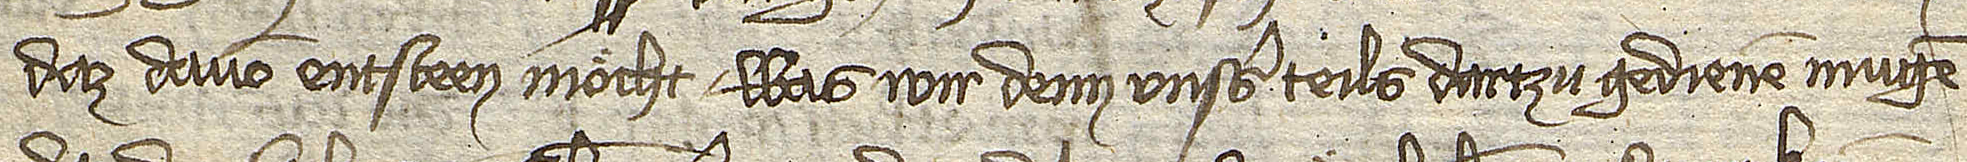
daʒ dauo* entſteen möcht / was wir denn vnſs* teils darcʒu gediene* muge*
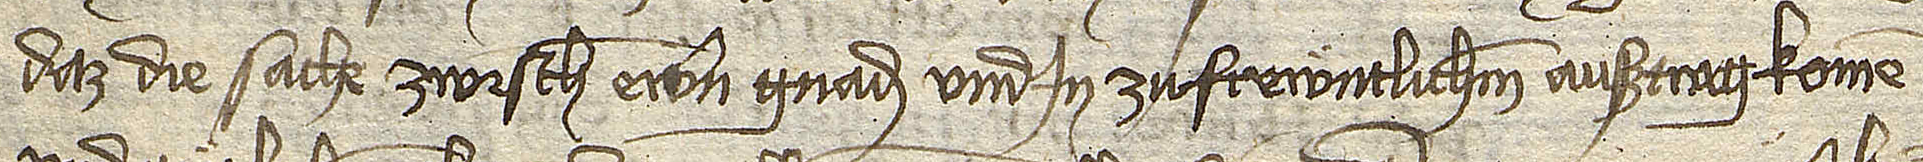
daʒ die ſache ʒwiſch* ew*n gnad* vnd In ʒu frewntlichm* auſʒtrag kome*
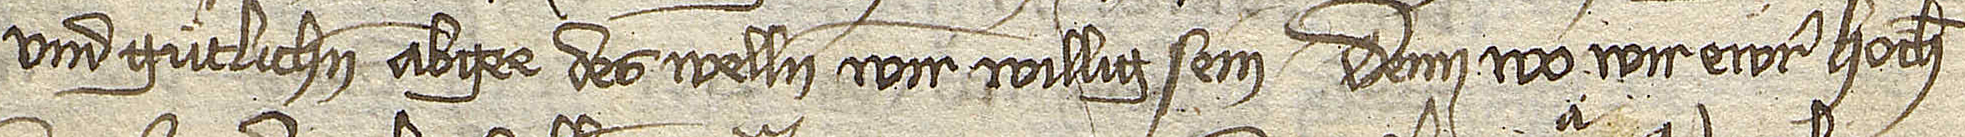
vnd gütlichn* abgee des welln* wir willig ſein / Denn wo wir ewr* hoch*
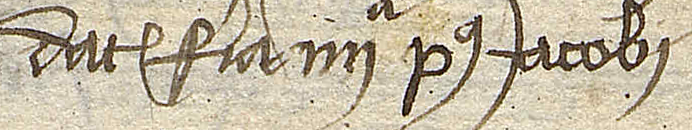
dat* f*ia iiii* p* Iacobi
